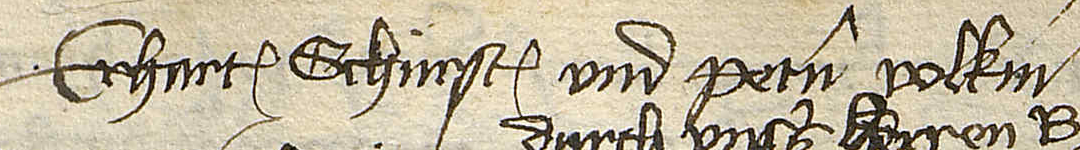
Erhart* Schürſt* vnd Petn* volkm*
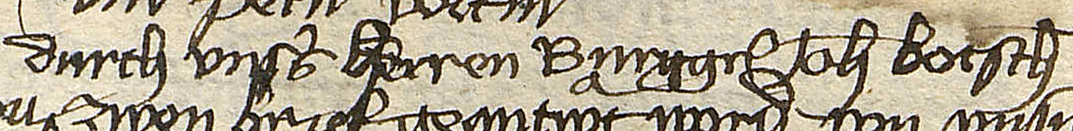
durch vnſ*s herren Burggr* Ioh* botſch*
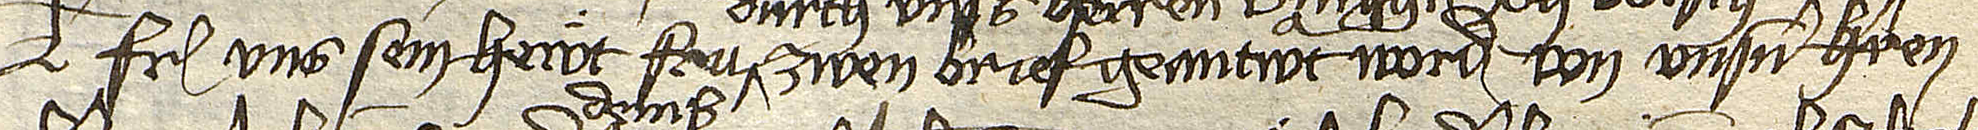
L* fr* vns ſein heẅt fru ʒwen brief geantw*t word* von vnſn* h*ren
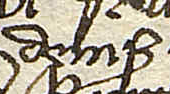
demſ*
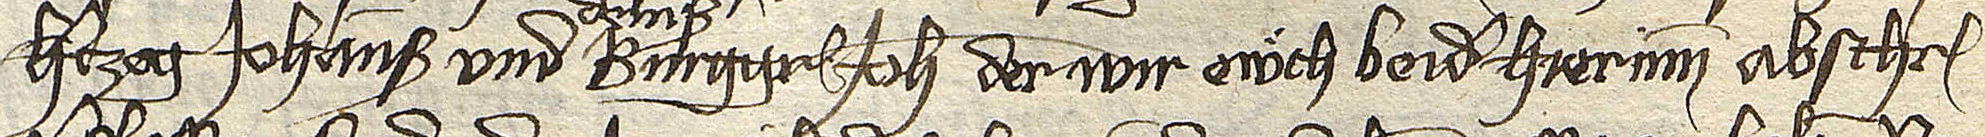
h*cʒog Iohanſ* vnd Burggr* Ioh* der wir eẅch beid* hierinn* abſchr*
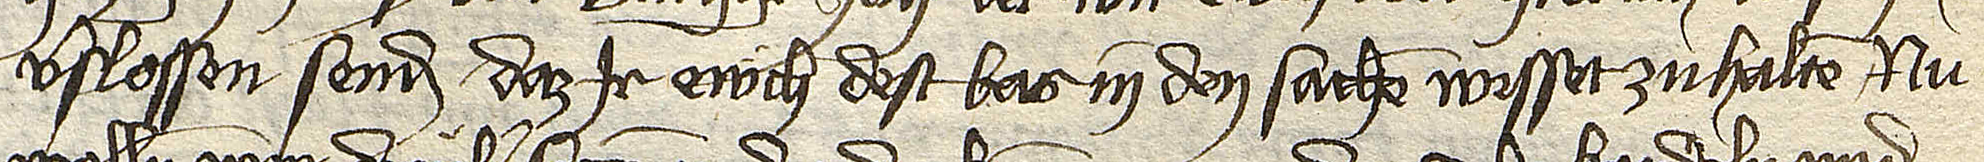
v*ſloſſen ſend* / daʒ Ir eẅch deſt bas in den ſache* wiſſet ʒu halte* / Nu
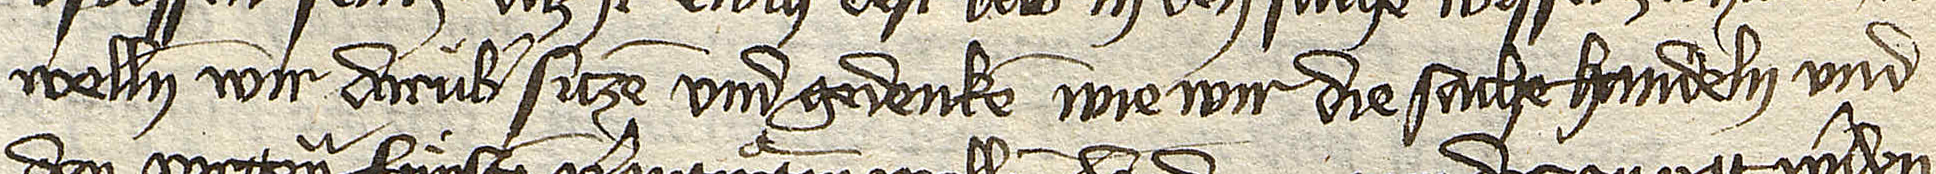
welln* wir darüb* ſicʒe* vnd gedenke* wie wir die ſache handeln vnd
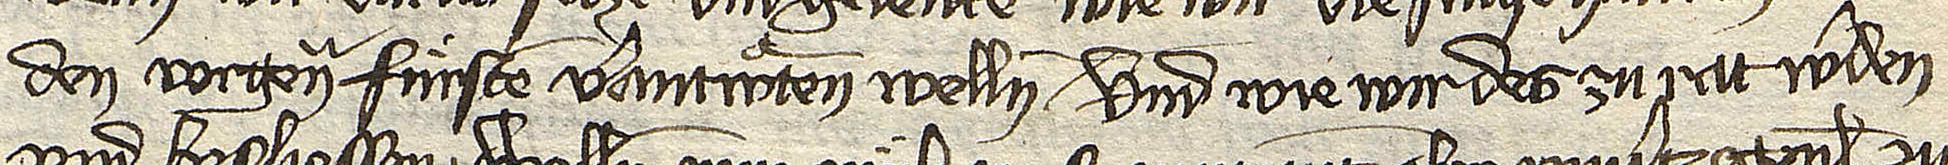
den vorgen* fürſte* v*antw*ten welln* / Vnd wie wir des ʒu rat w*den
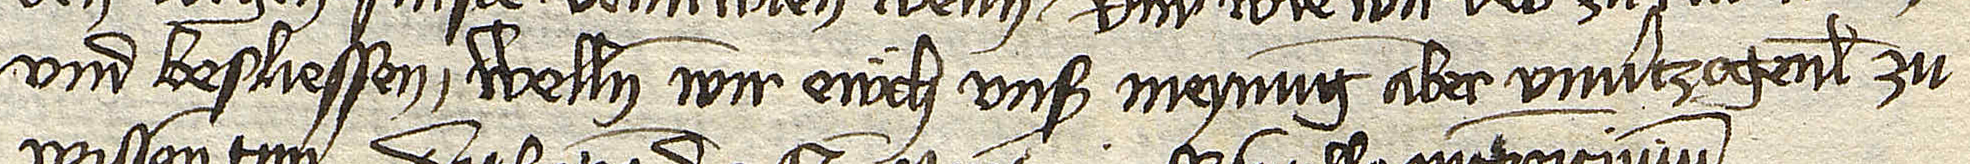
vnd beſlieſſen / Welln* wir eẅch vnſ* meynu*g aber vnu*cʒogenl* ʒu
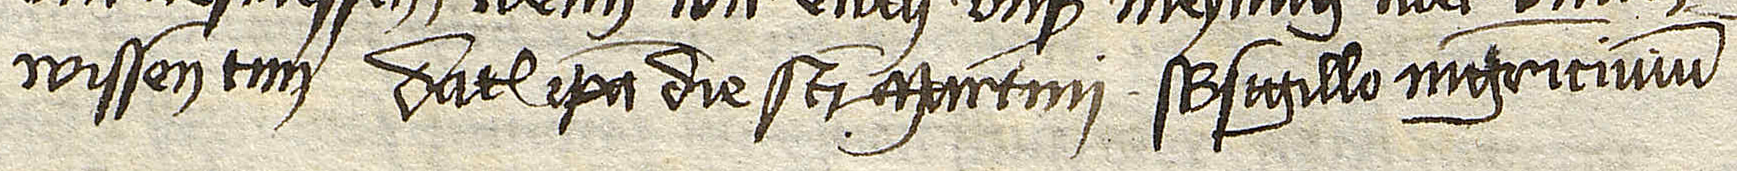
wiſſen tun Dat* ipa* die ſ*ci Martini . ſ* ſigillo m*griciuiu*
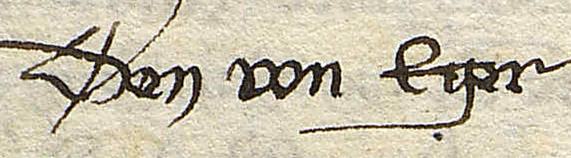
Den von Eger
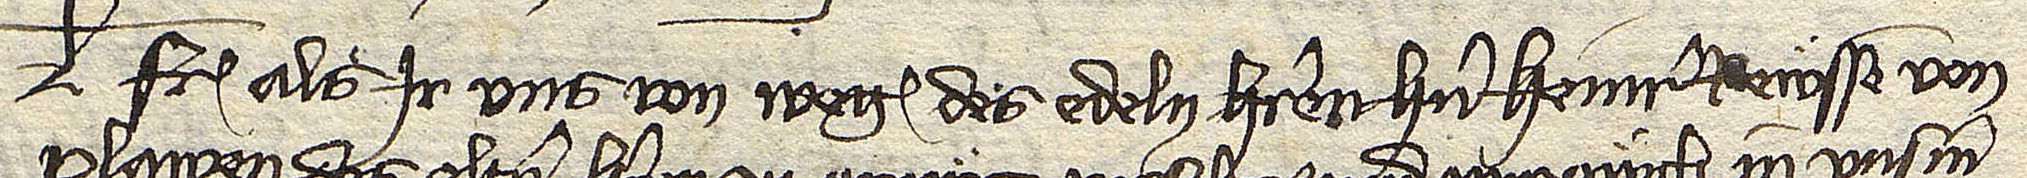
L* fr* als Ir vns von weg* des edeln h*ren hn* heinr* Reẅſſe* von
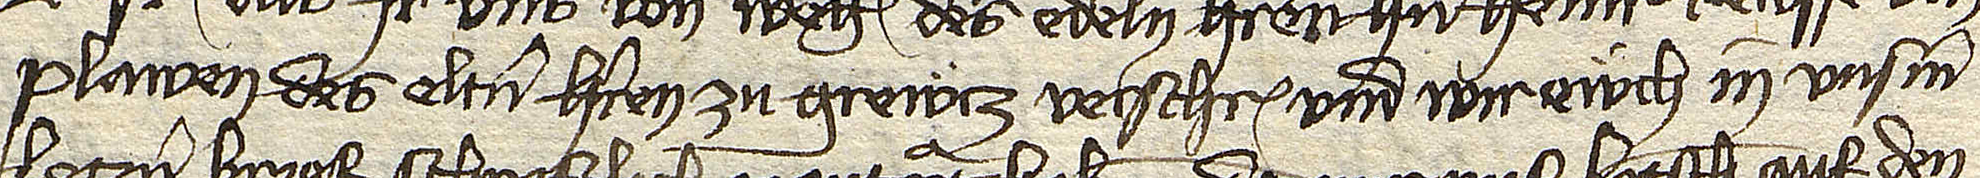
Plawen des eltn* h*ren ʒu greẅcʒ verſchr* vnd wir eẅch in vnſm*
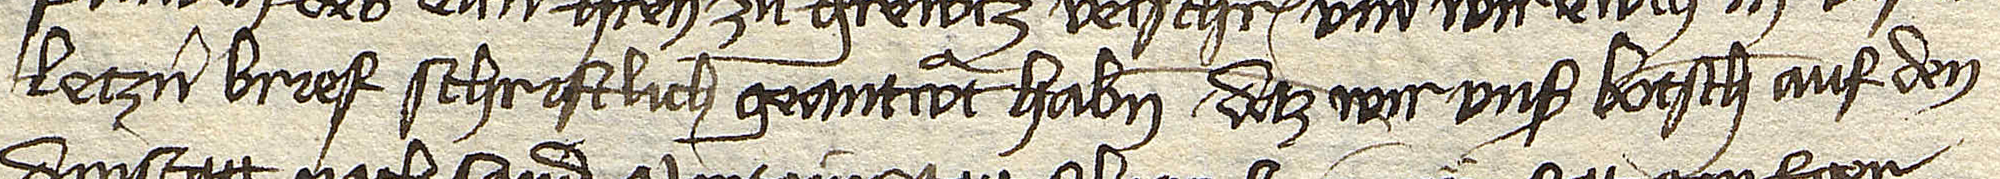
lecʒn* brief ſchriftlich geantw*t habn* / Daʒ wir vnſ* botſch* auf den
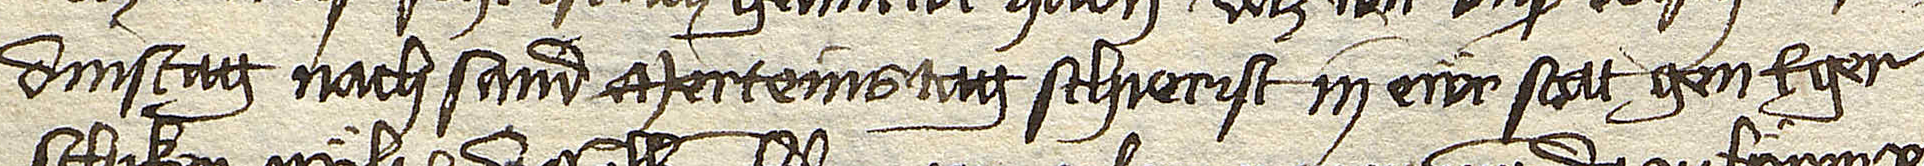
Dinſtag nach ſand Merteins tag ſchieriſt in eẅr ſtat gen Eger
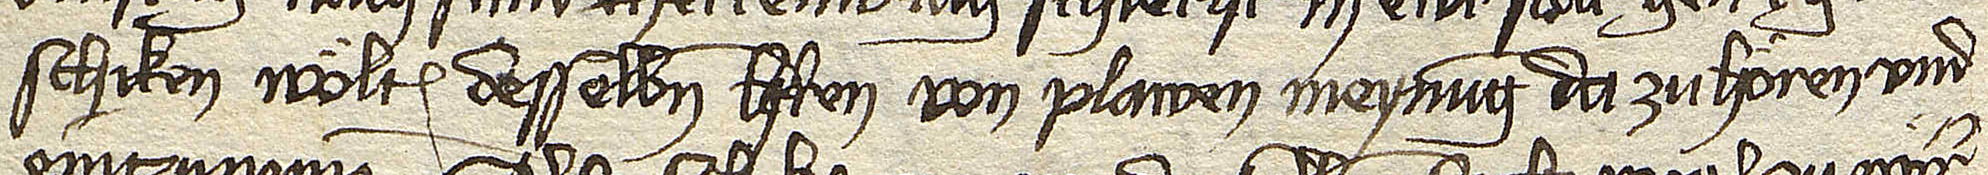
ſchiken wölt* deſſelbn* h*ren von plawen meynu*g da ʒu hören vnd
